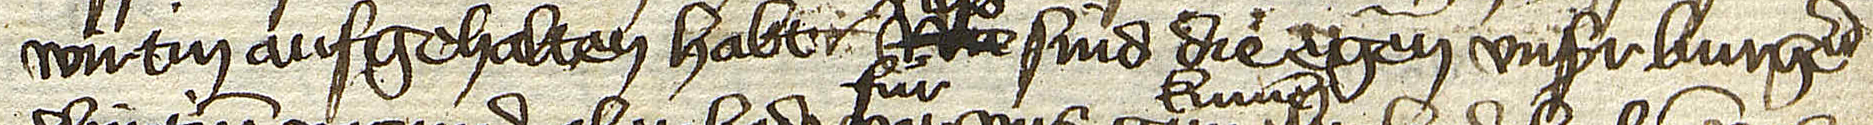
wirtin aufgehalten habt / Nu ſind die egen* vnſ*r burge*
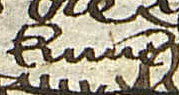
kume*
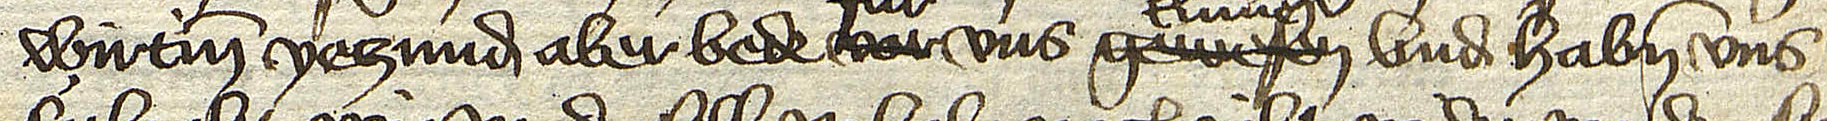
wirtin* yecʒund* aber bede vor vns geweſen vnd hab*n vns
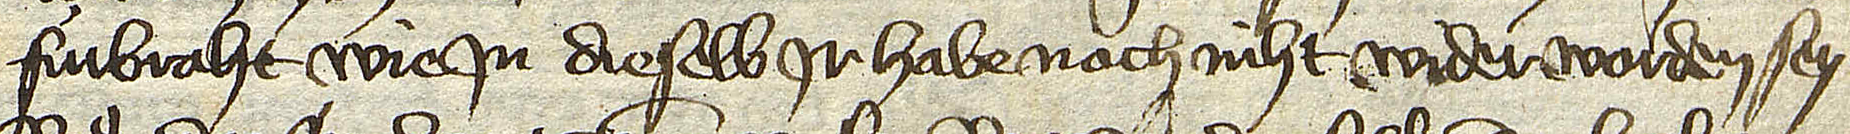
fürbraht wie In dieſelb Ir habe noch niht wider worden ſey
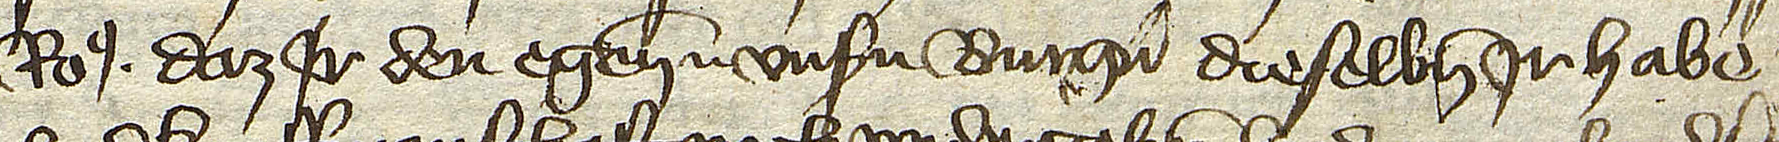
Ro* . daʒ Ir den egen* ~ vnſ*n Burg*n dieſelb*n Ir habe
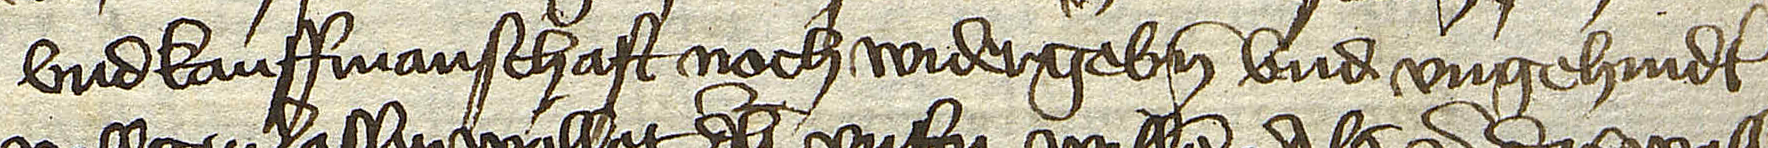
vnd kauffmanſchaft noch widergeb*n vnd vngehind*t
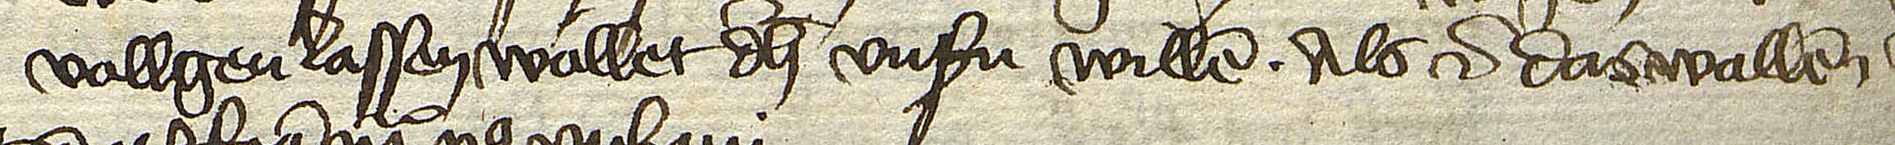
vollgen laſſen wöllet d*h* vnſ*n wille* . Als ec* das wolle* ec*
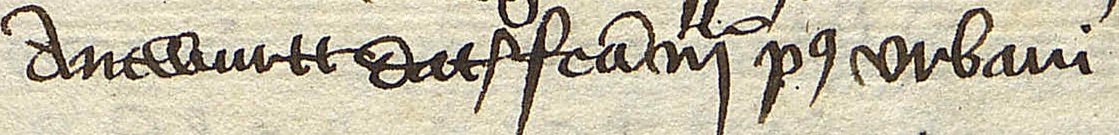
Antwurtt dat* fea* iii* p* vrbani
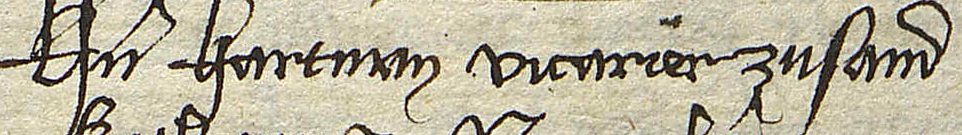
H*n Hartman vicarier ʒu ſand
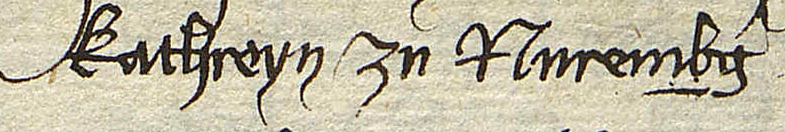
kathreyn ʒu Nuremb*g
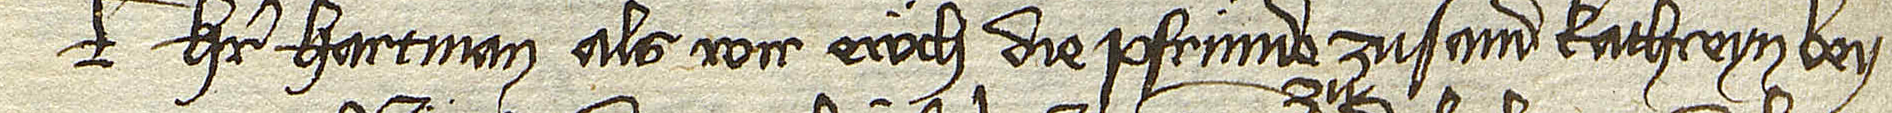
L* h*r Hartman als wir ewch die pfründe ʒu ſand kathreyn bey
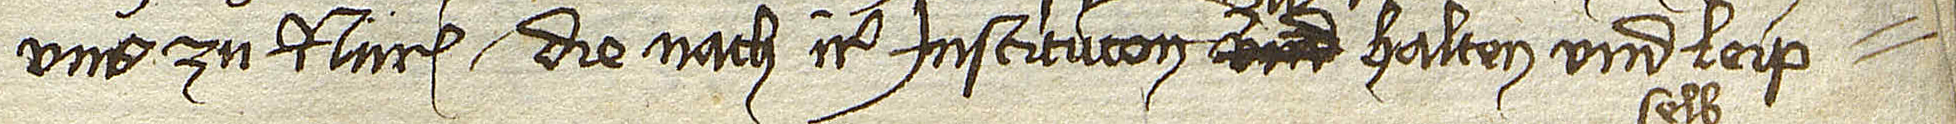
vns ʒu Nür* / die nach ir* Inſtituc*on vnd halten vnd leip =
